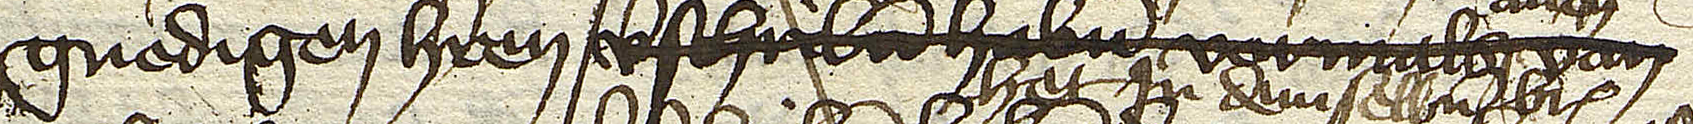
gnedigen h*ren v*ſchrib*n hab*n vormals von
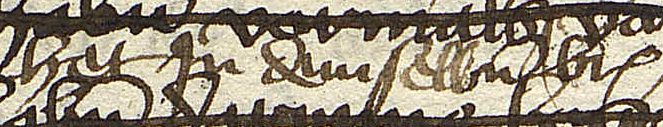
het In demſelb*n br*
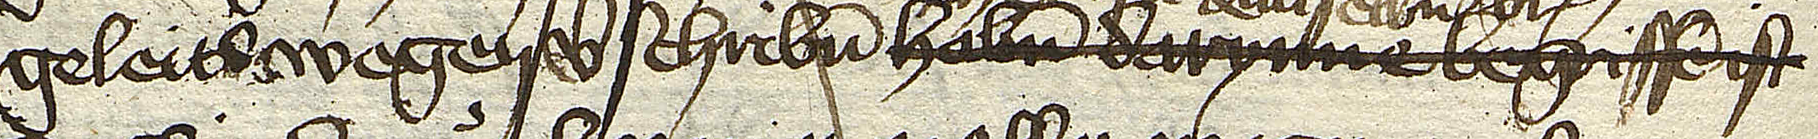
geleits wegen v*ſchrib*n hab*n darynne begriffe* iſt
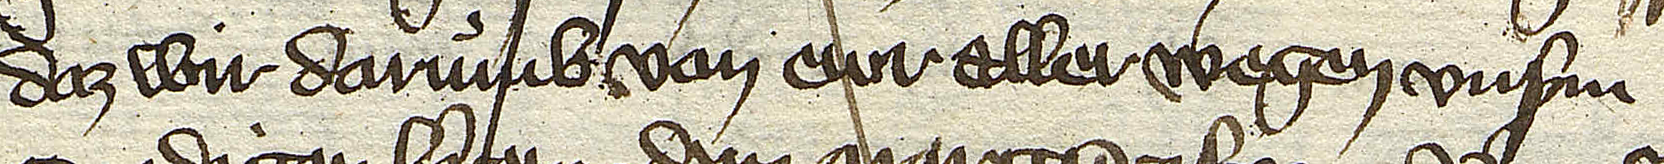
daʒ wir darümb von ewr aller wegen vnſ*m
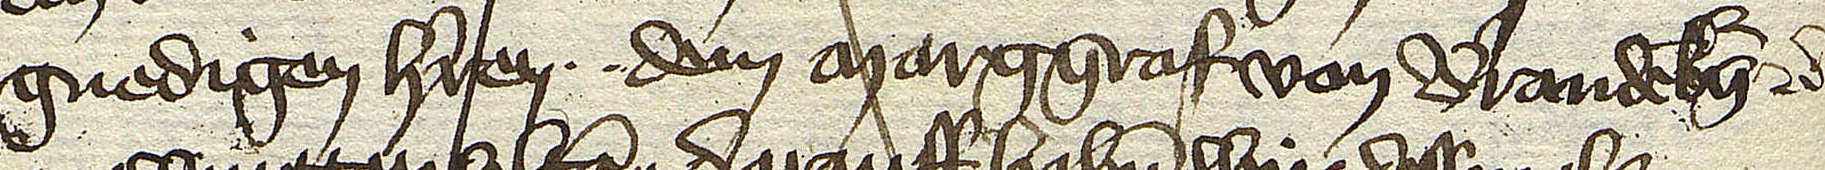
gnedigen h*ren ~ dem Marggraf von Brande*b*g ec*
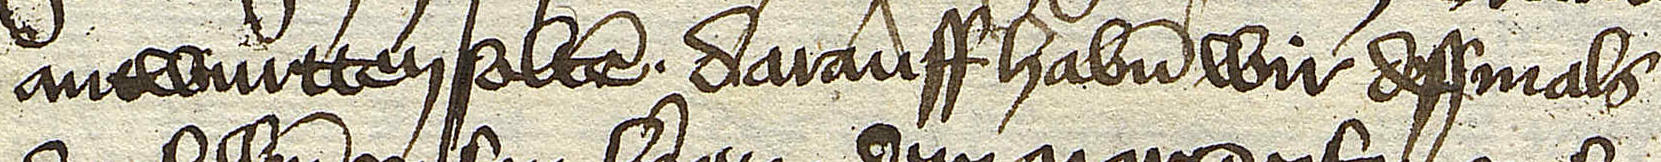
antwurtten ſolte* . darauff hab*n wir deſſmals
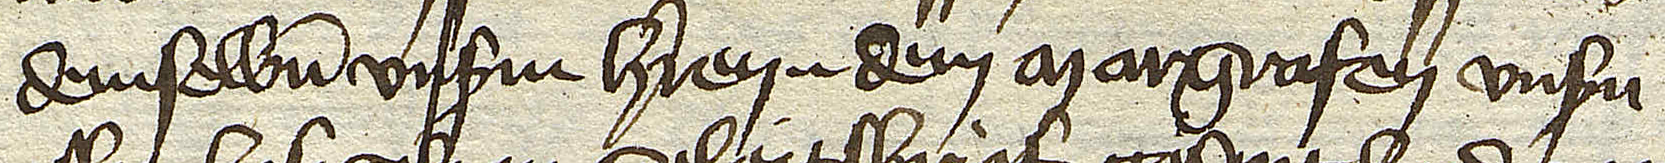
demſelb*n vnſ*m h*ren ~ dem Margrafen vnſ*n
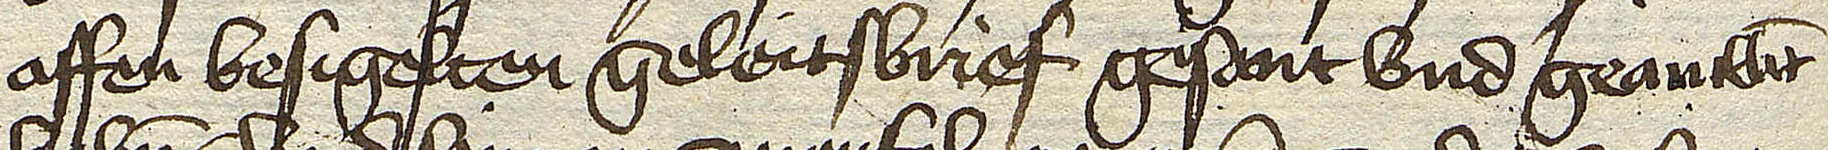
offen beſigelten geleitſbrief geſant vnd geantw*t
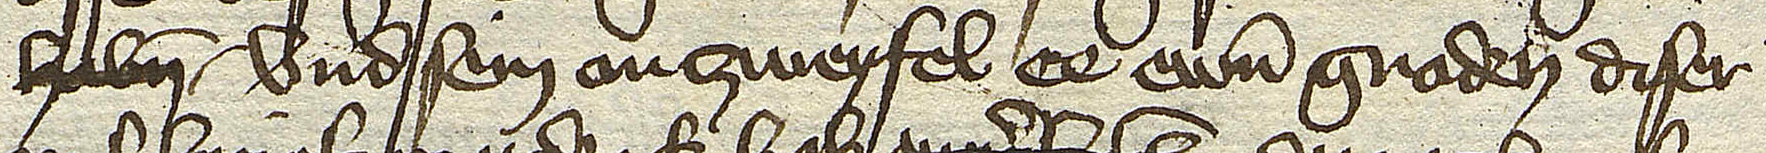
hab*n / vnd ſein oncʒweyfel ee ew*n gnaden diſer
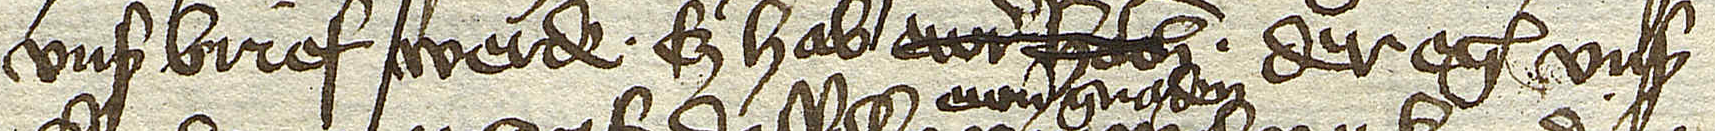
vnſ* brief werde . Eʒ hab ew*r hoch* . der eg* vnſ*
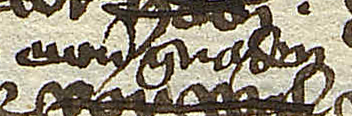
ew*n gnaden
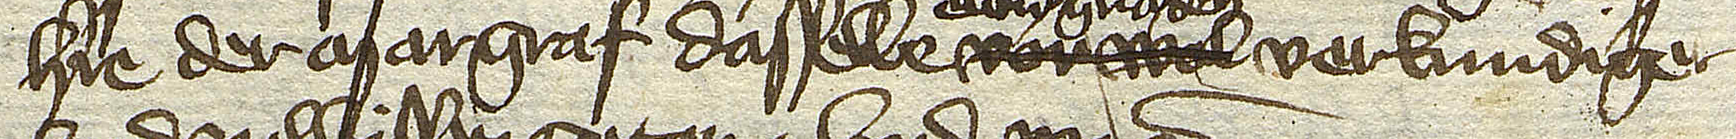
h*re der Margraf daſſelbe vor wol verkundiget
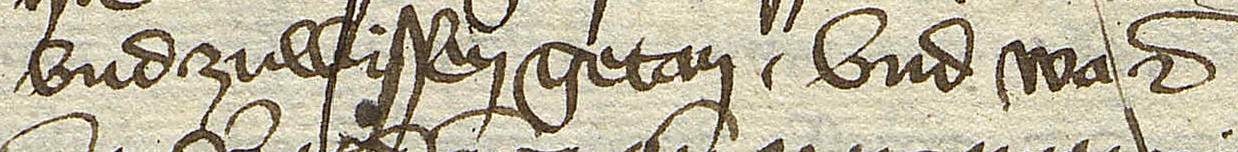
vnd ʒuwiſſen getan / vnd wo ec*
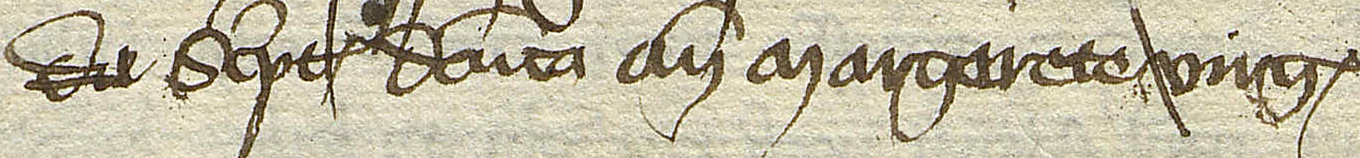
da Sc*pt* doica* an* Margarete virg*
